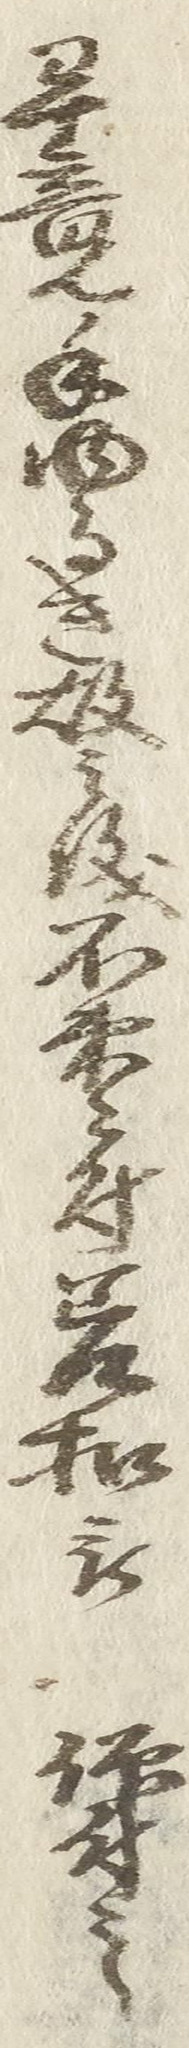畢竟手ゆるき故之儀不弟二付差扣被仰付之
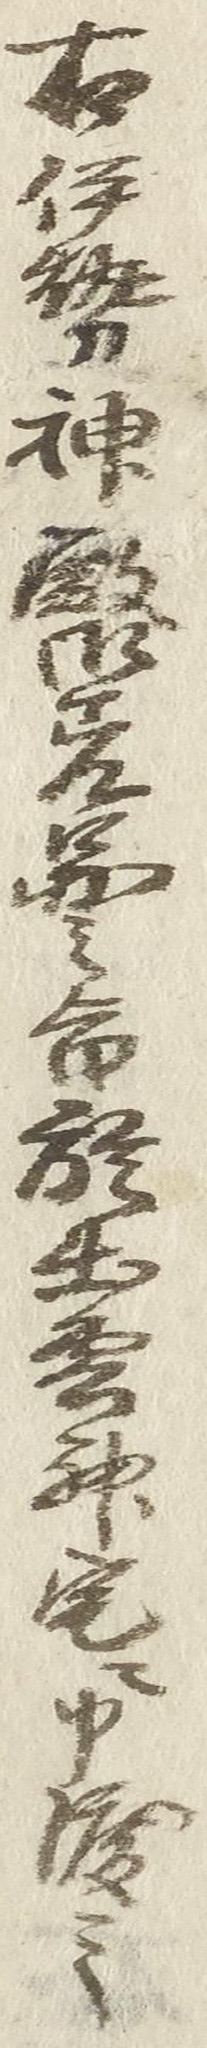右伊勢神殿御差図之旨於出雲神宅二申渡之

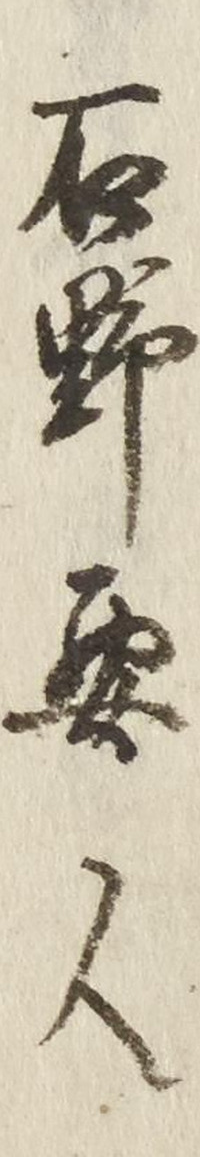石野要人
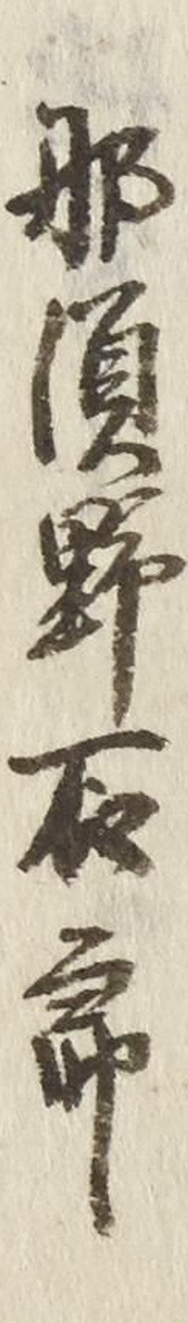那須野石郎
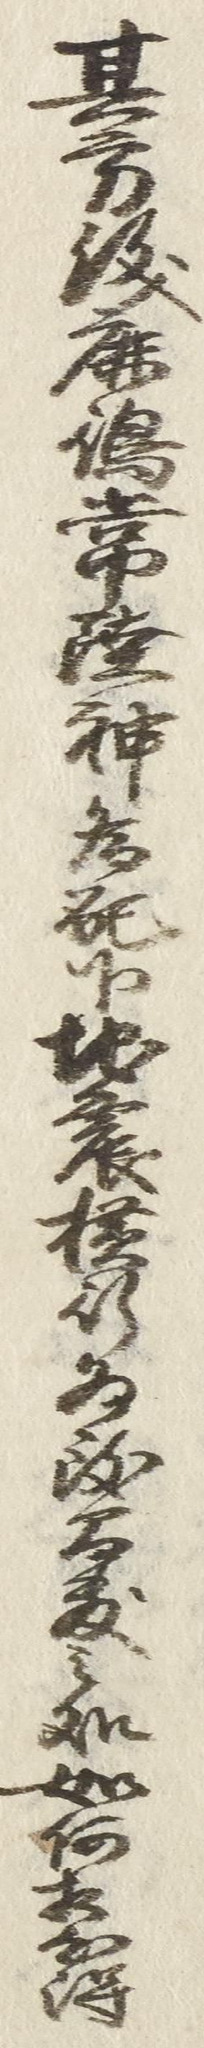其方儀廉嶋常陸神矦配下地震横行為致間敷之所如何相心得
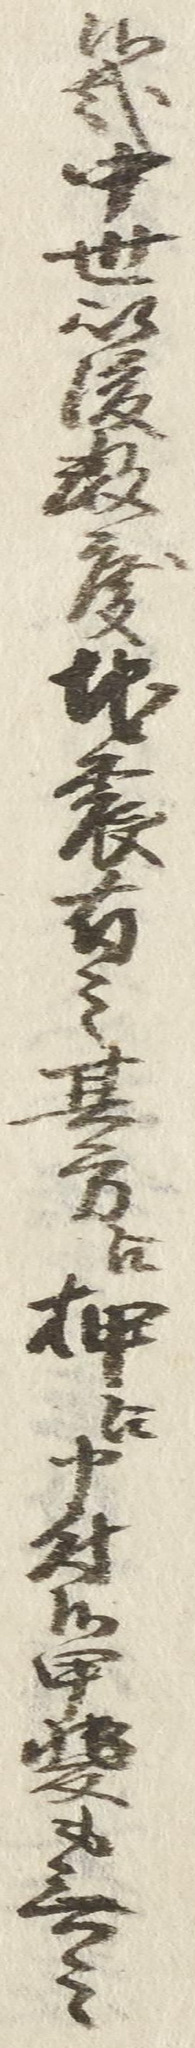候哉中世以後数度地震有之其方江押江申付候甲斐も無之
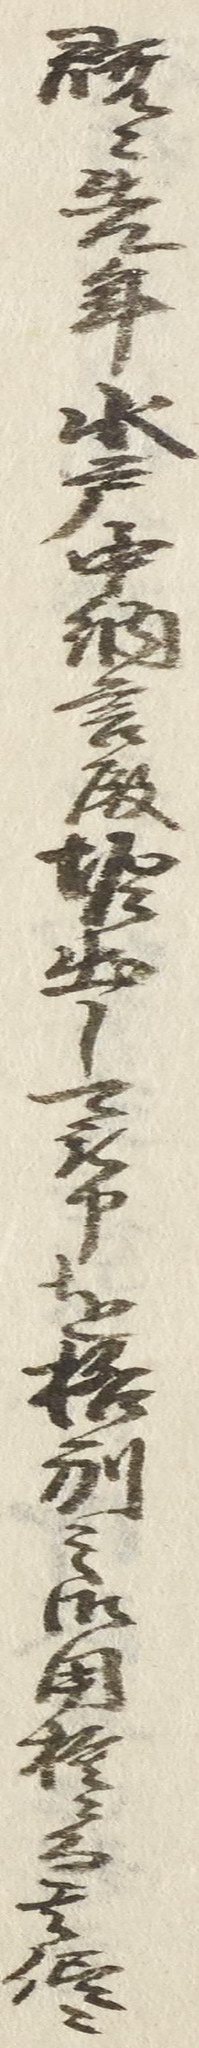既二先年水戸中納言殿堀出して可被申を格別之御用捨二而其儘二
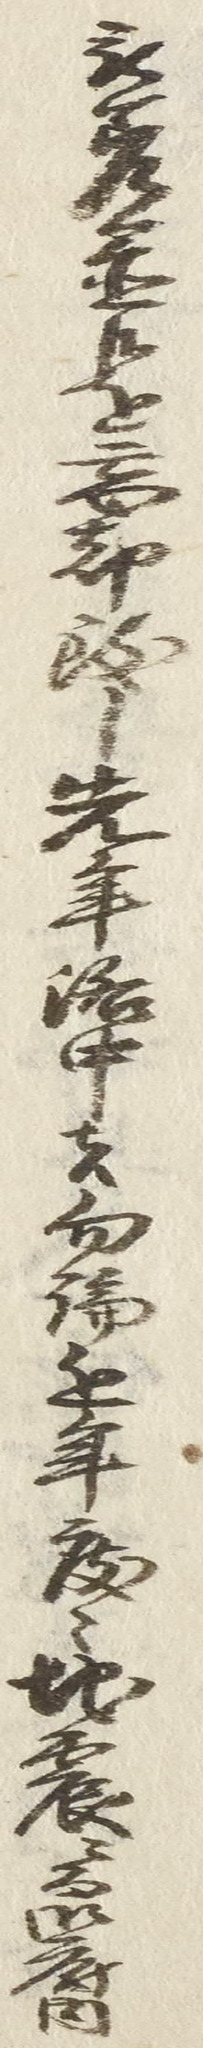被差置候を忘却致し先年洛中は勿論近年度々地震二而御府内
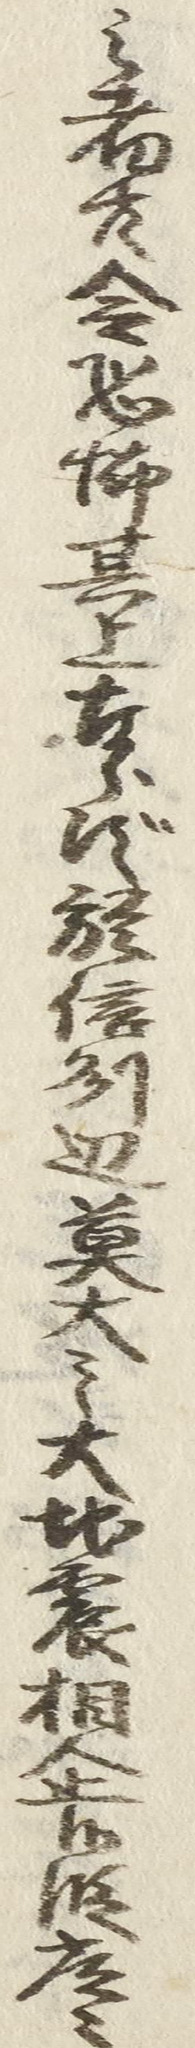之者共令恐怖其上ならす於信州辺莫大之大地震相企候段常々
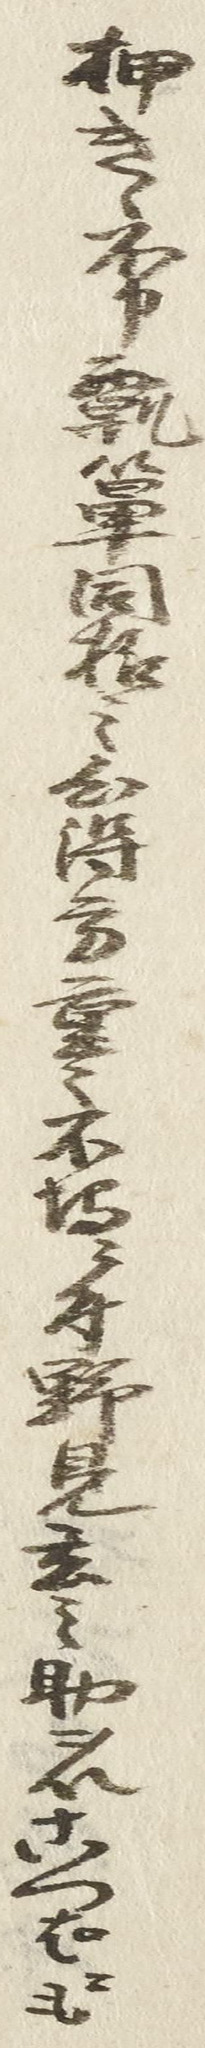押きゝ不申瓢箪同様之心得方重々不埒二付野見玄之助を以こつば二も
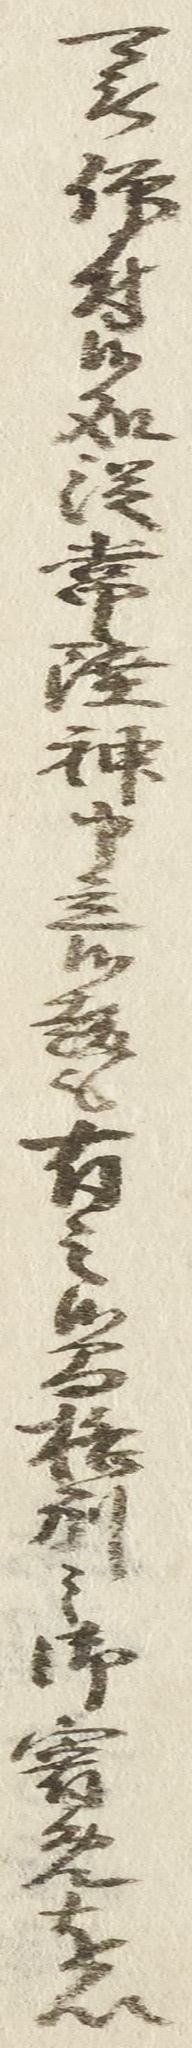可被仰付侯処従常陸神申立侯趣も有之候間格別之御容恕を以
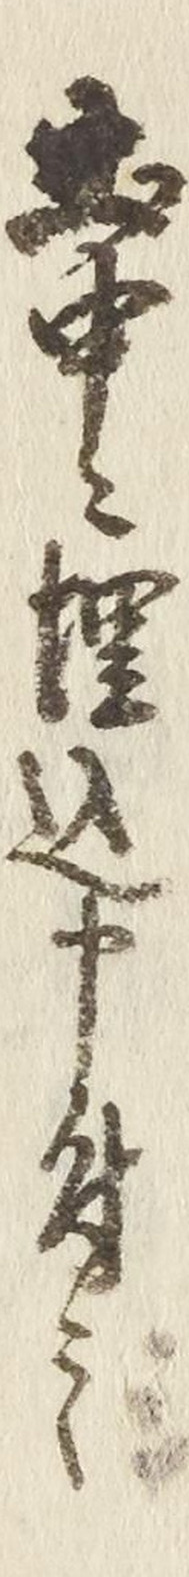土埋二埋込申付之
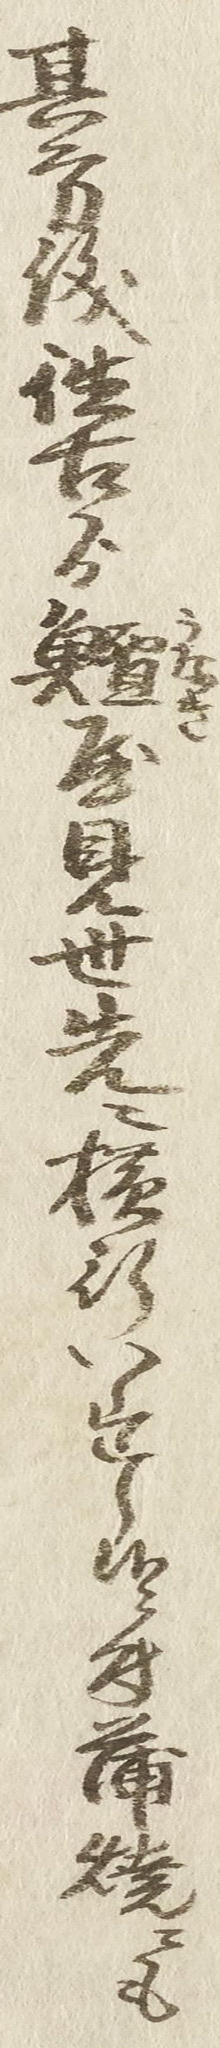其方儀往古ゟ鰻屋之見世先江横行いたし候二付蒲焼二も
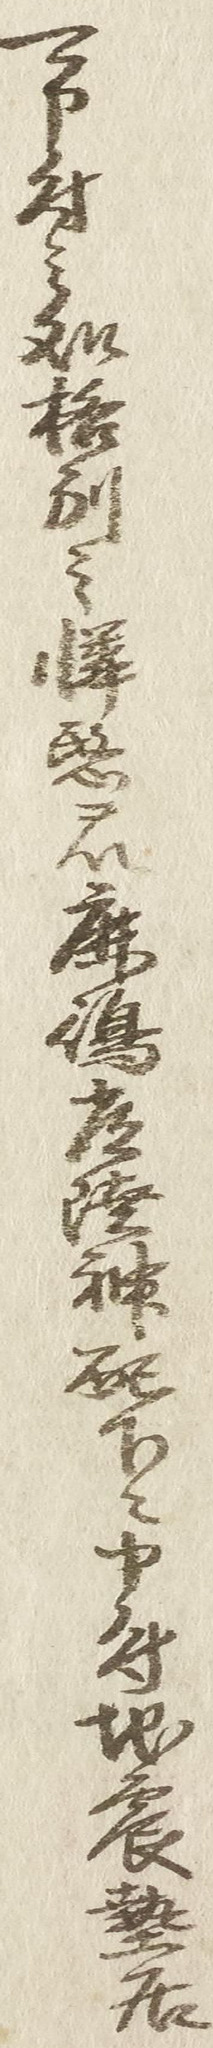可申付之処格別之憐憫を以廉嶋常陸神配下二申付地震蟄居
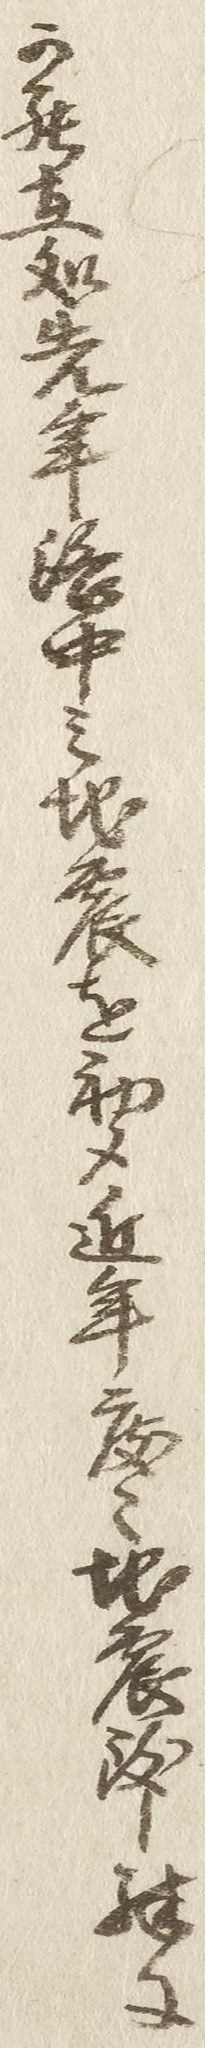可罷在候処先年洛中之地震を初メ近年度々地震致し殊二
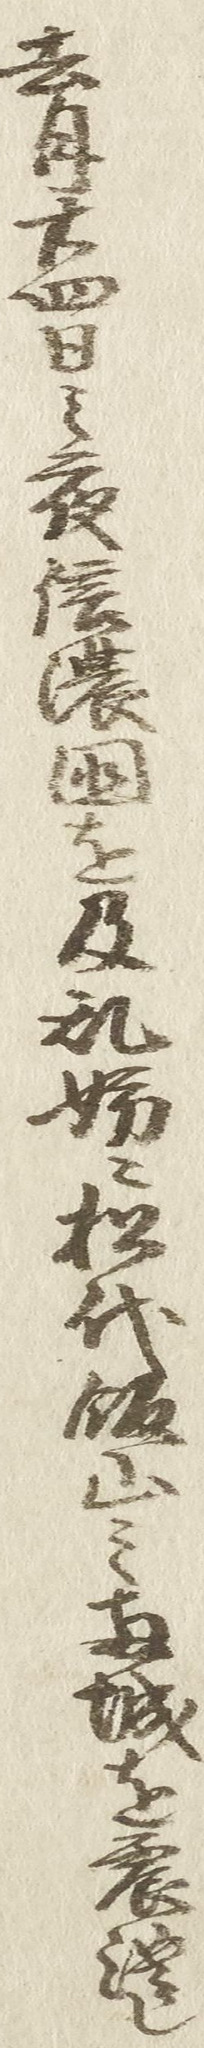去月廿四日之夜信濃之国を及乱妨松代飯山之両城を震潰し
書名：従往古地震御届書記誌之一
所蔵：東京大学地震研究所図書室 Earthquake Research Institute Library, The University of Tokyo, JAPAN
